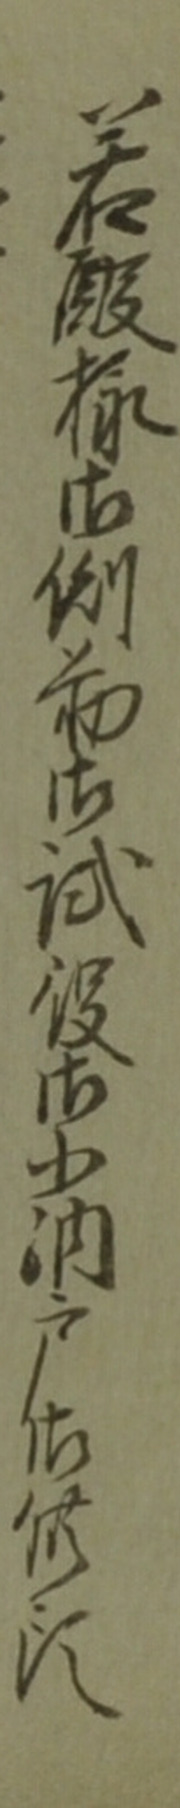若殿様御側勤御試役小納戸御供頭
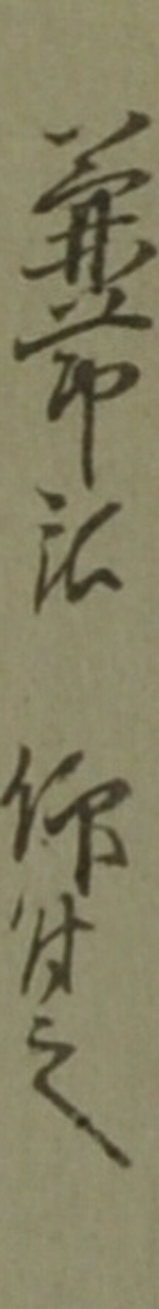兼帯被仰付之
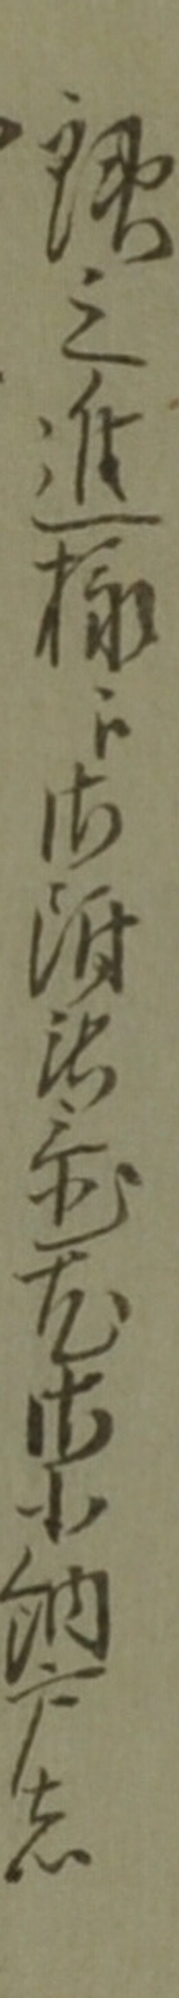鉄之進様江御附被置尤御小納戸者
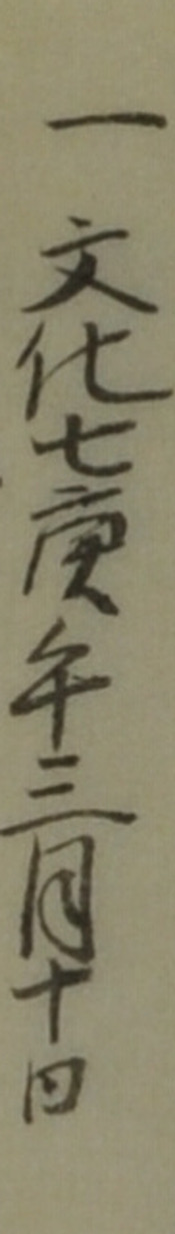一文化七庚午三月十日
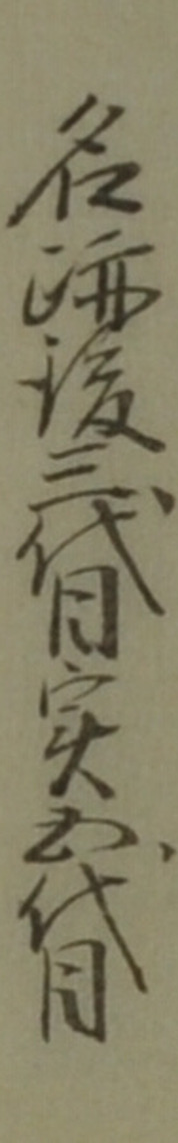名跡後三代目実五代目
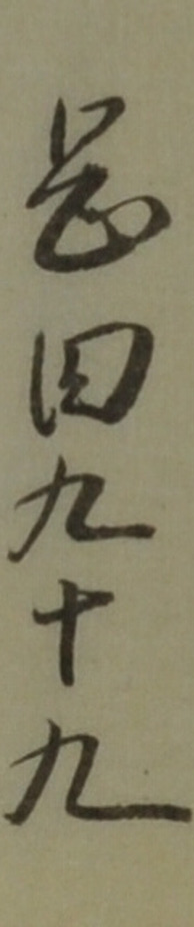岡田九十九
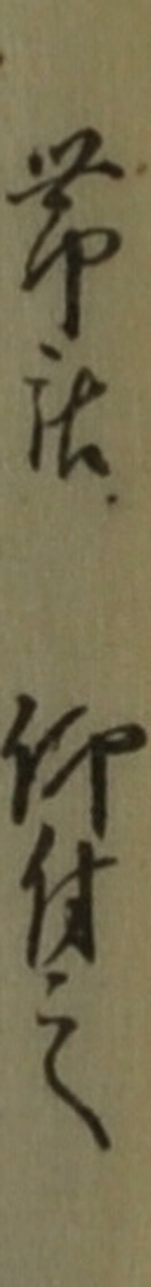帯被仰付之
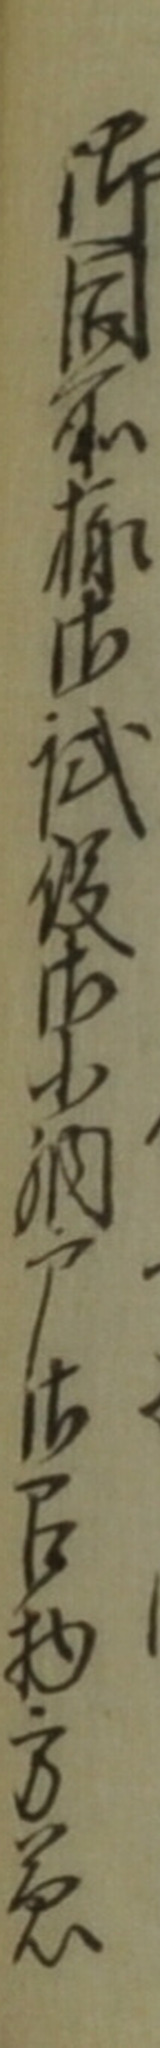一御同前様御試役御小納戸御召物方兼
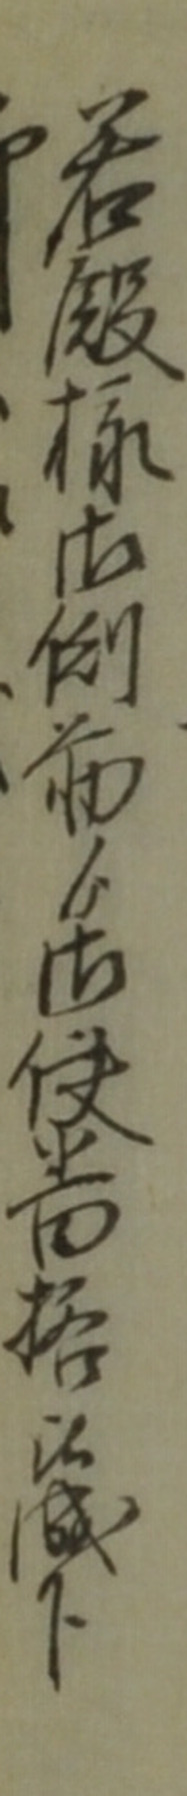若殿様御側勤ゟ御使番格被成下
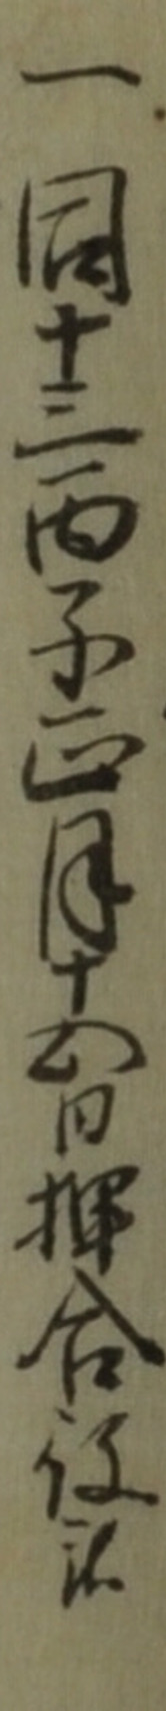一同十三丙子正月十五日押合役被
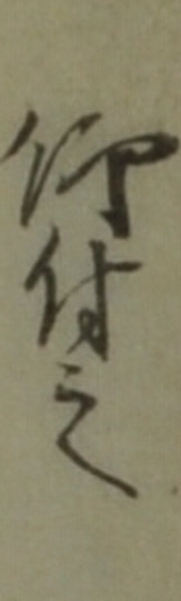仰付之
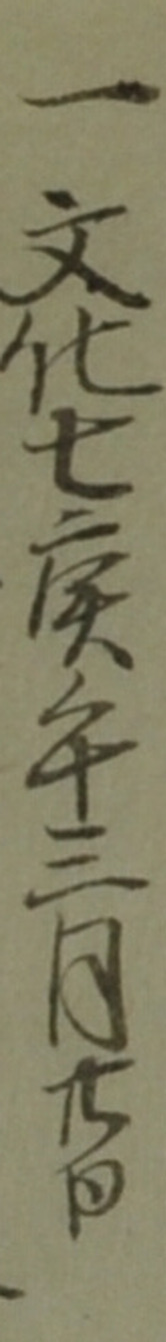一文化七庚午三月廿日
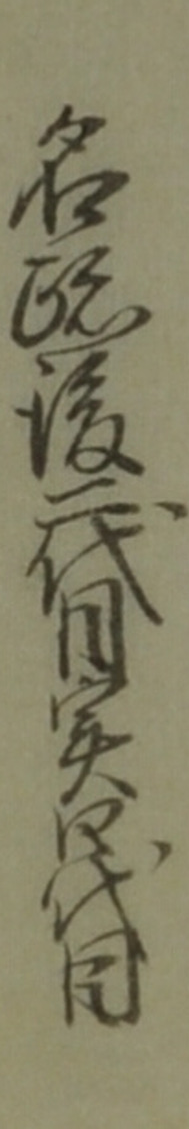名跡後二代目実四代目
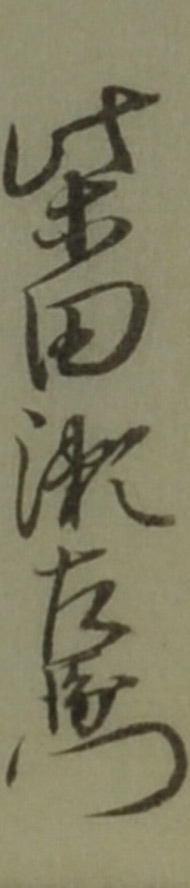柴田瀬左衛門
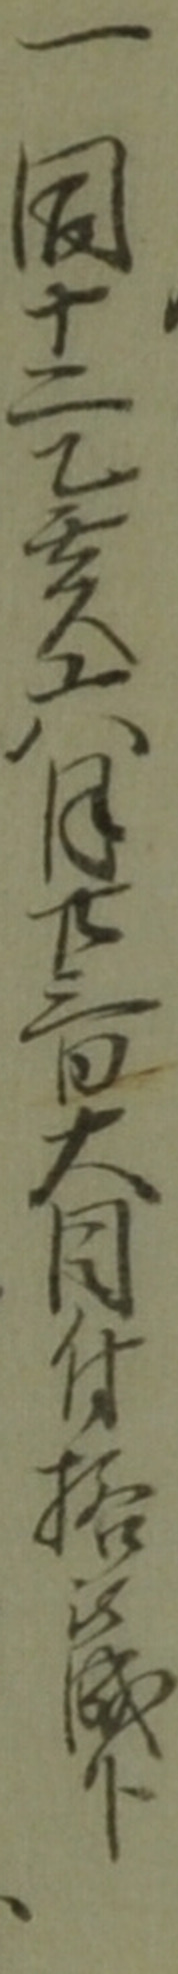一同十二乙亥六月廿三日大目付格被成下
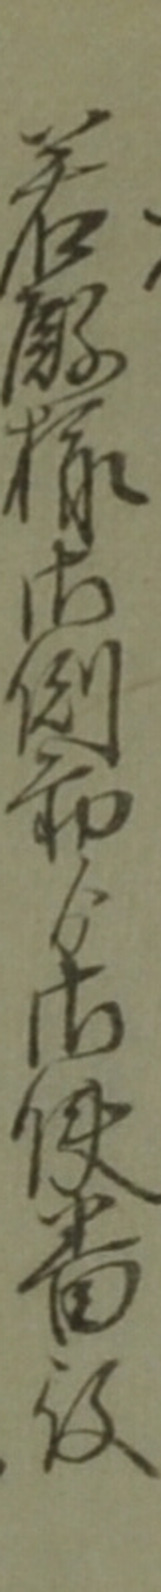若殿様御側勤ゟ御使番役
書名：諸御役代々録（四）
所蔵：伊那市立高遠町図書館・合同会社AMANE
